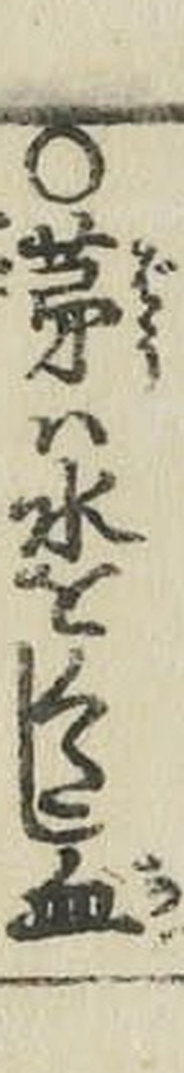○茅は水をくたし血
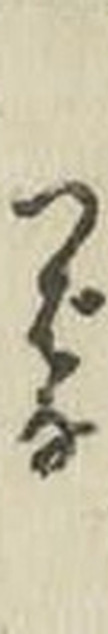つばな
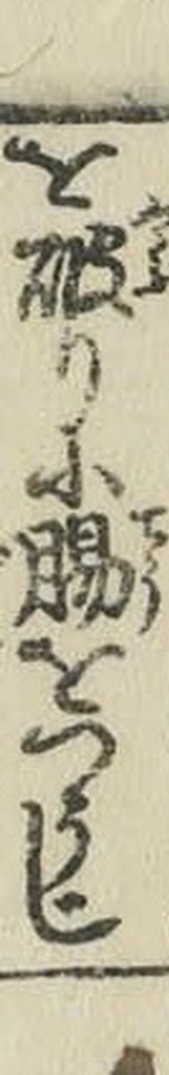を破り小腸をつうじ
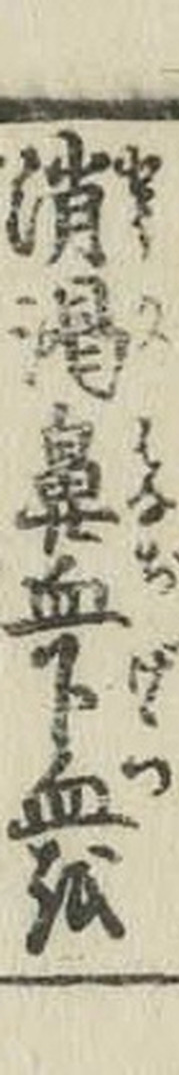消渇鼻血下血を
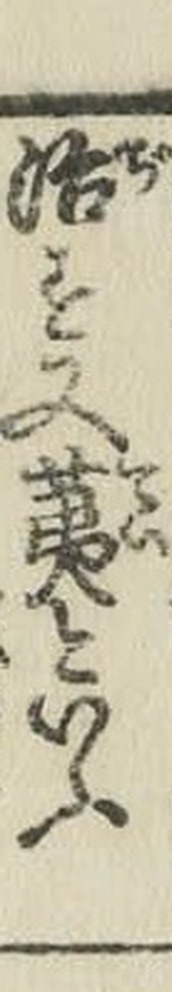治す又荑といふ
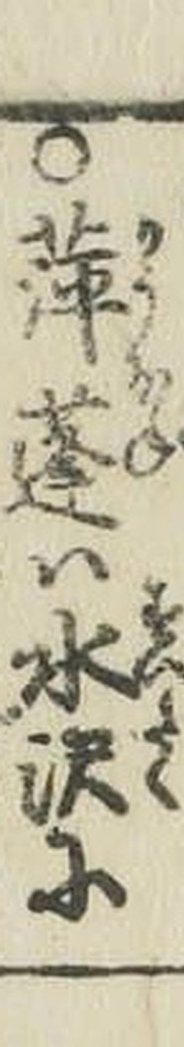○萍蓬は水沢に
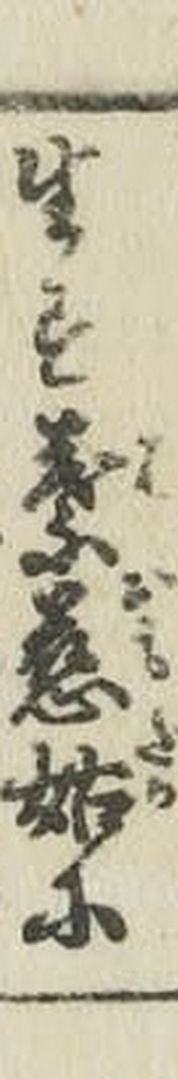生す葉慈姑に
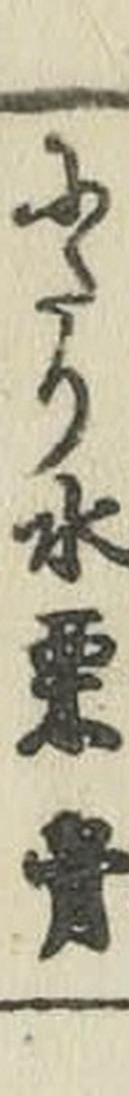にたり水栗骨
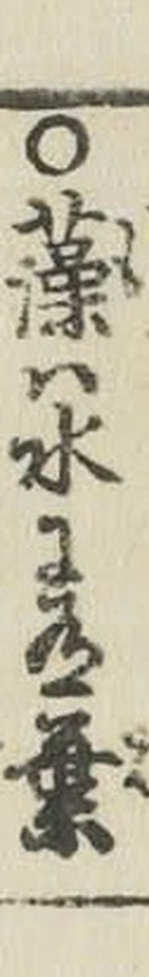○藻は水に有葉
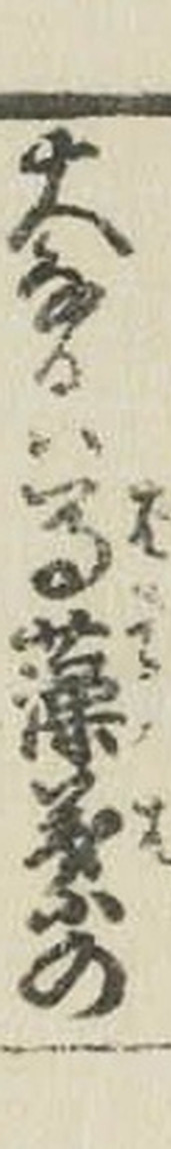大なるは馬藻葉の
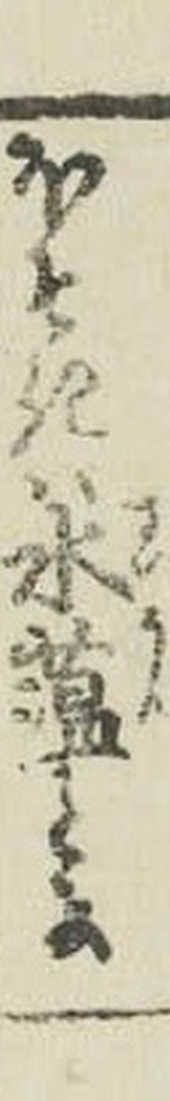ほそきは水蕰とす
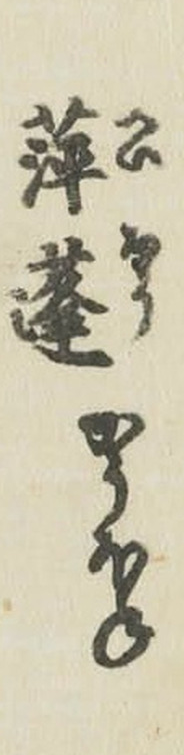萍蓬かうほね
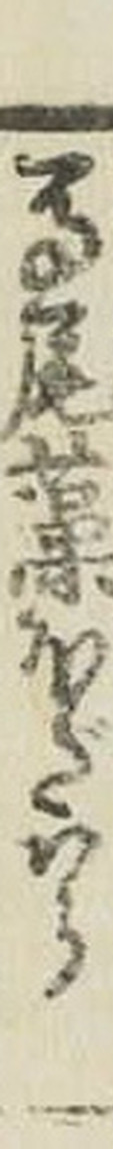馬尾藻ほだはら
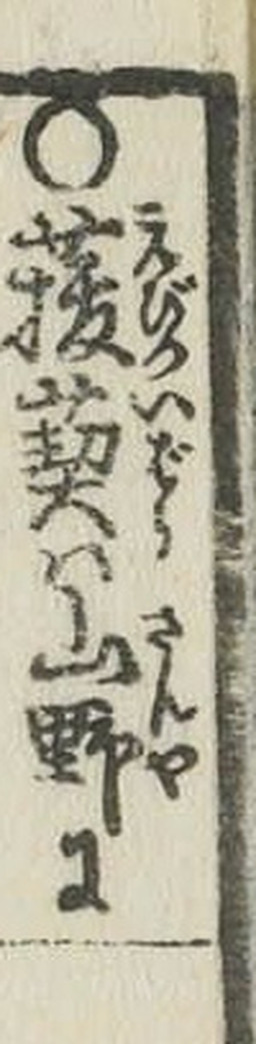○菝葜は山野に
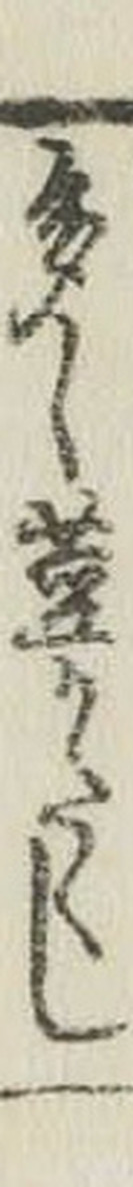多し茎かたくし
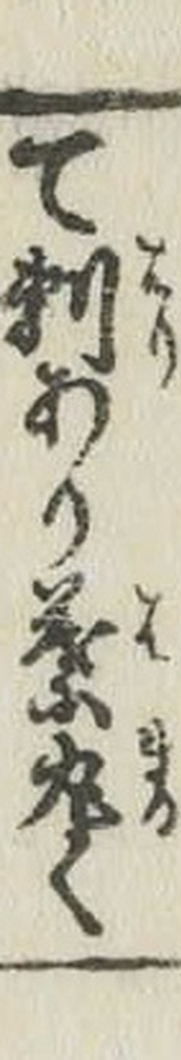て刺あり葉丸く
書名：増補頭書訓蒙図彙大成 10巻 9:巻之20
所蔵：東京学芸大学教育コンテンツアーカイブ
